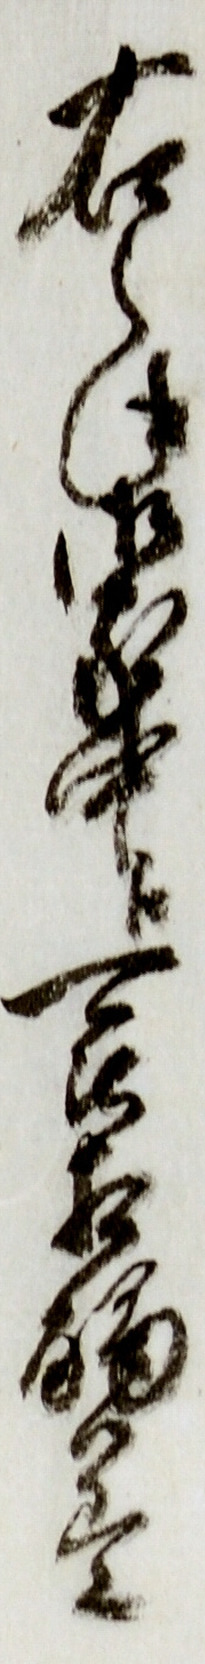右之趣御家中え可被相触候已上
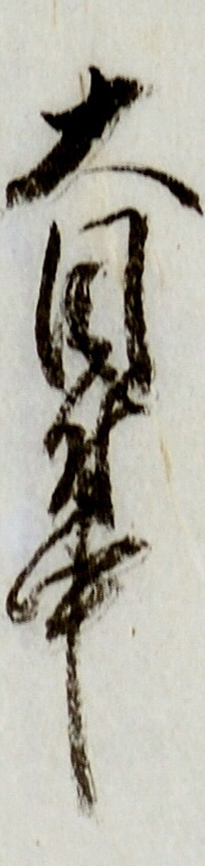大目付中
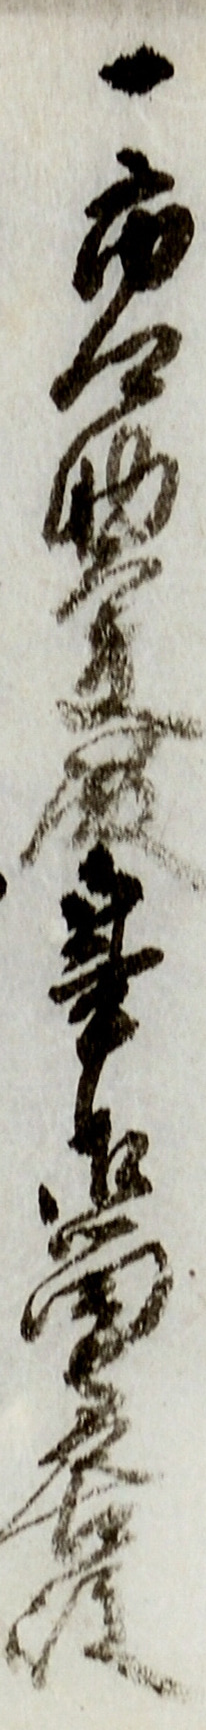一市郷助大夫殿御事御留守居役
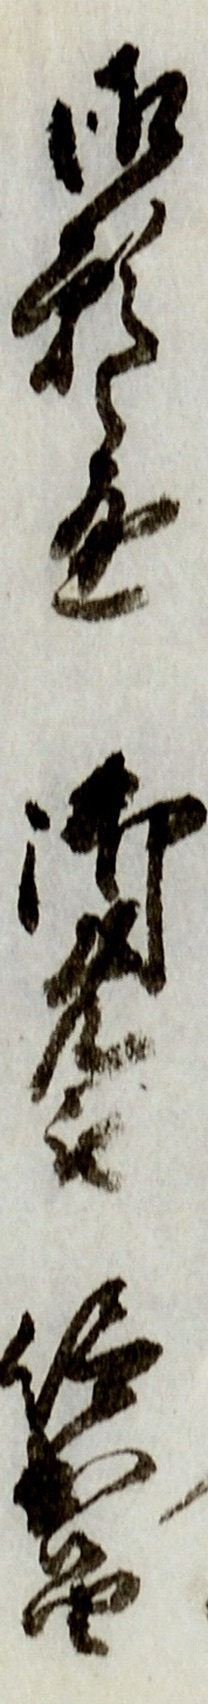御願之通御免被仰出候由
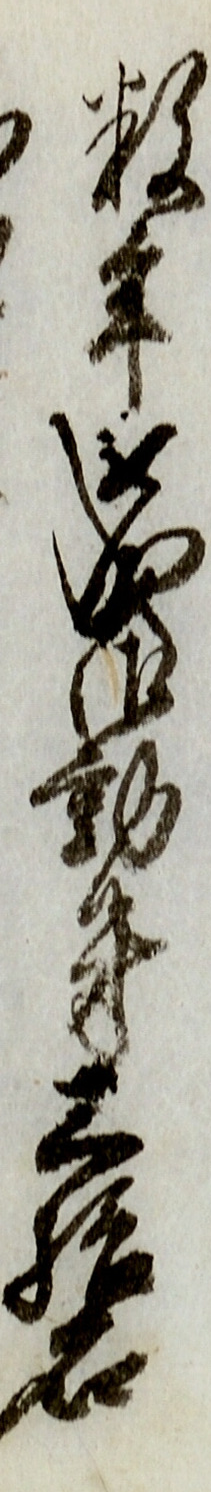数年被成御勤候付三拾石
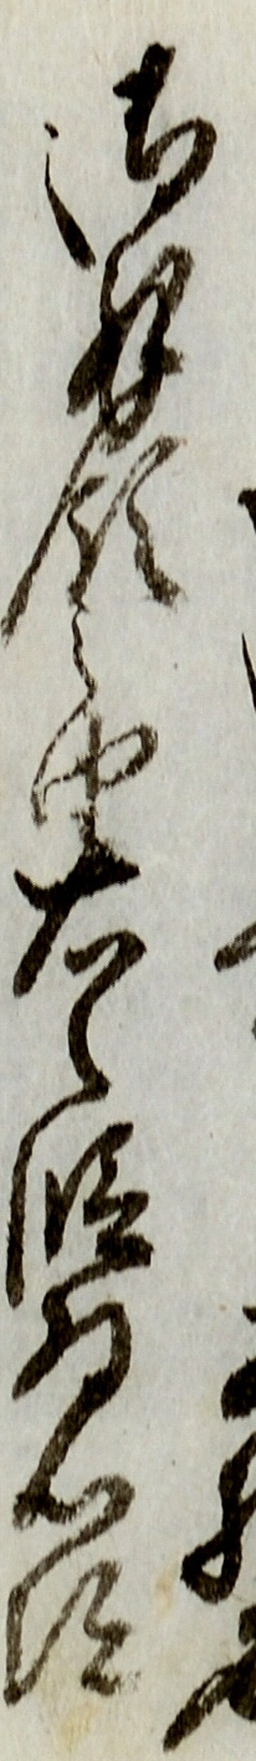御拝領之由右之段為心得
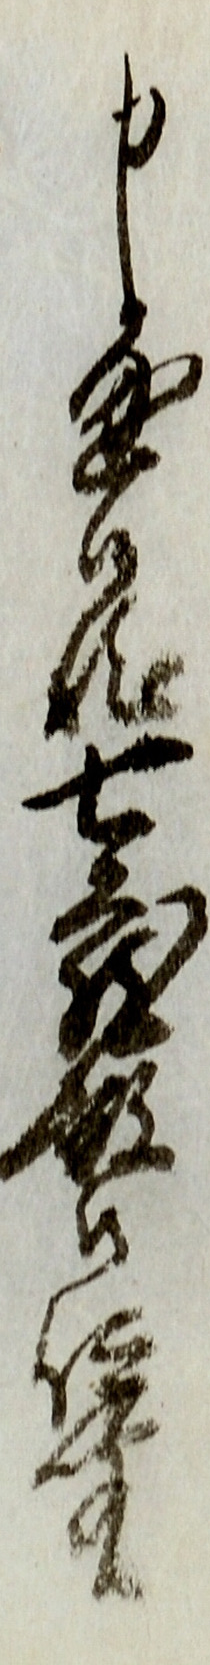申通候様七蔵殿被仰聞候
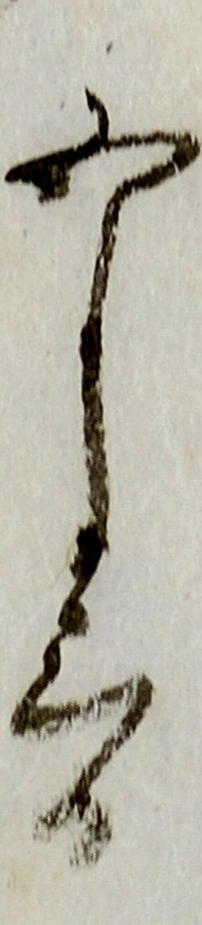五月三日
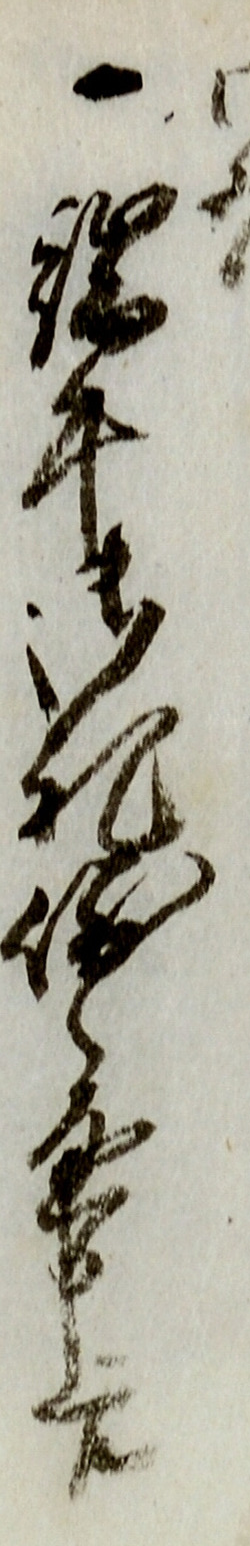一端午御礼例之通申上候
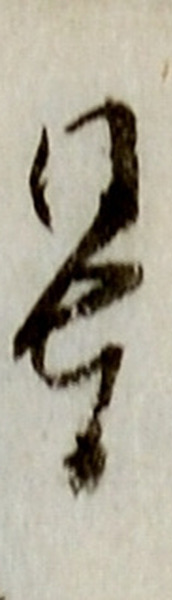同七日
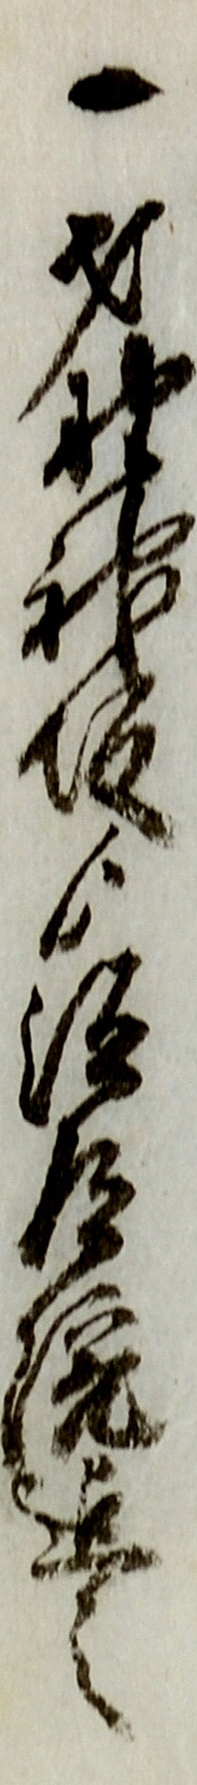一才野神坂より法道院迄之
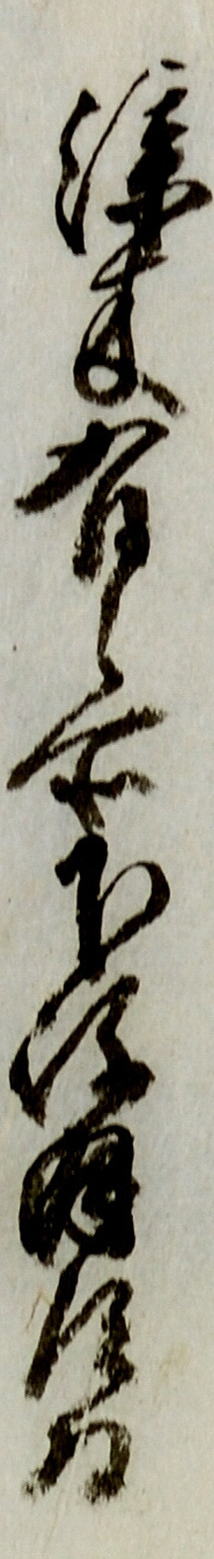漆木有之所下役同道
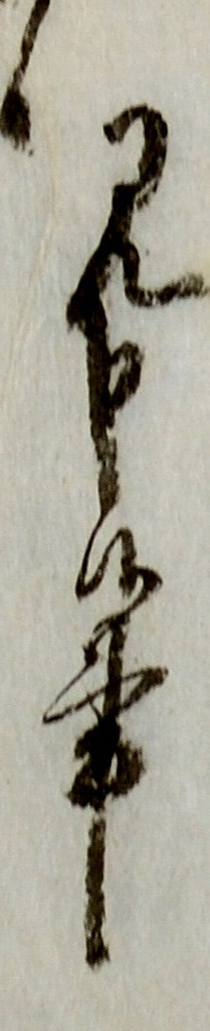見申候事
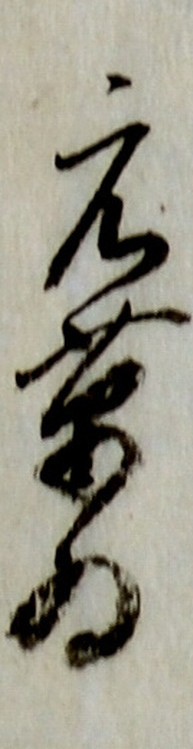元草為
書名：諸事御用留帳
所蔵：伊那市立高遠町図書館・合同会社AMANE
